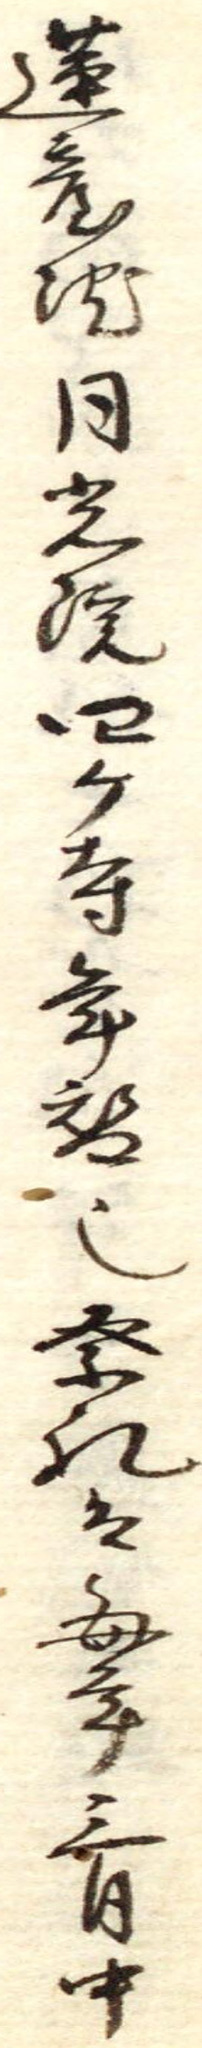蓮台院月光院四ヶ寺年替也祭礼は毎年三月中
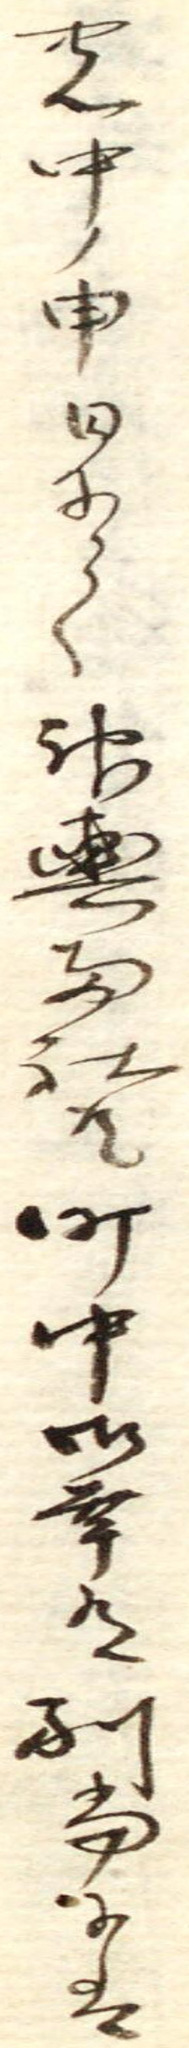の中ノ申日に神輿両社共町中御幸有別当には
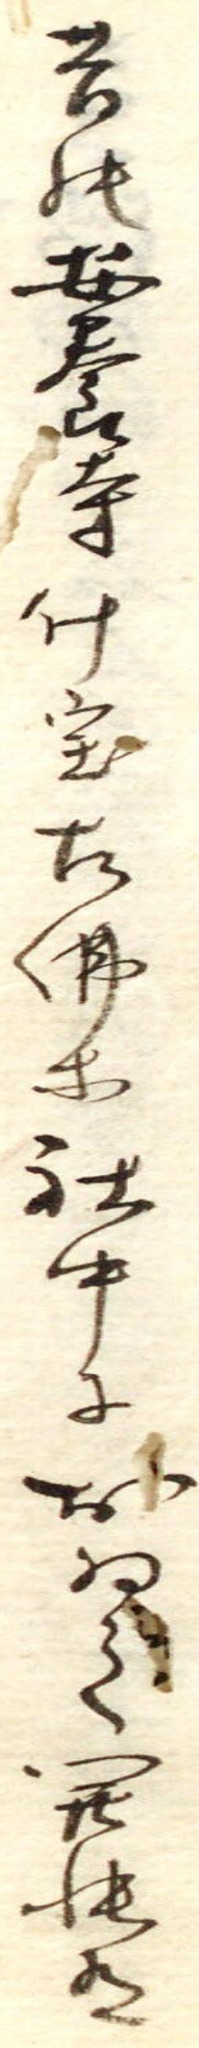昔の安養寺什宝古仏等社中におゐて開帳有
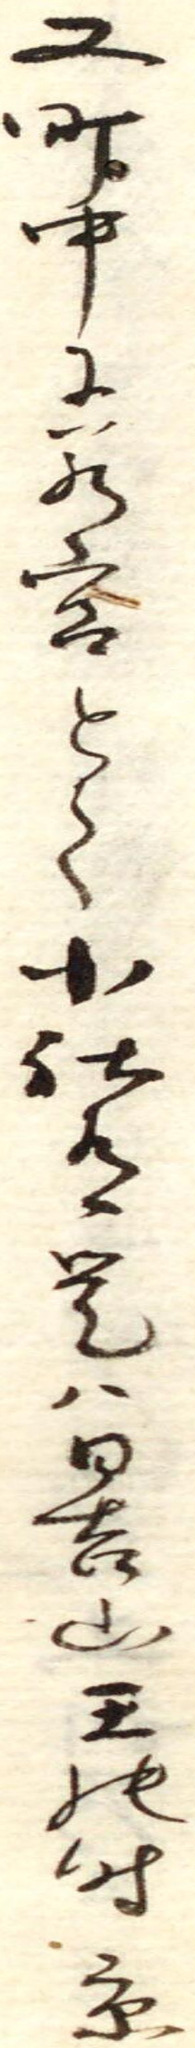又町中に若宮とて小社有是は日吉山王の時京
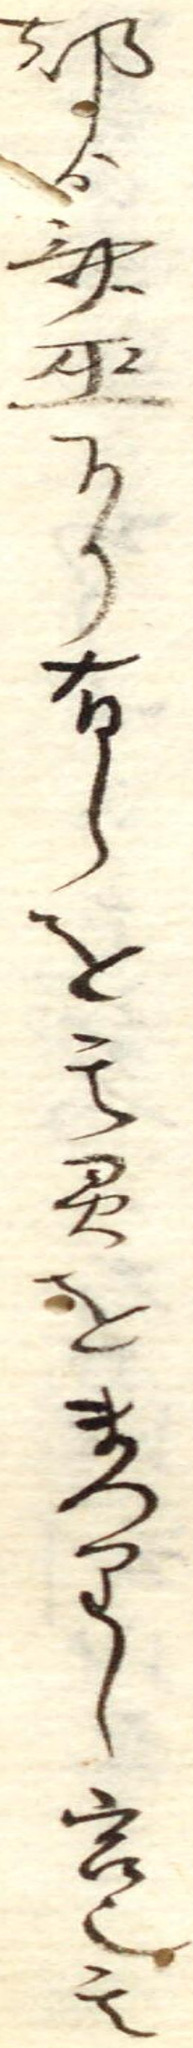都ゟ齋巫下り有しを其霊をまつりし宮也其
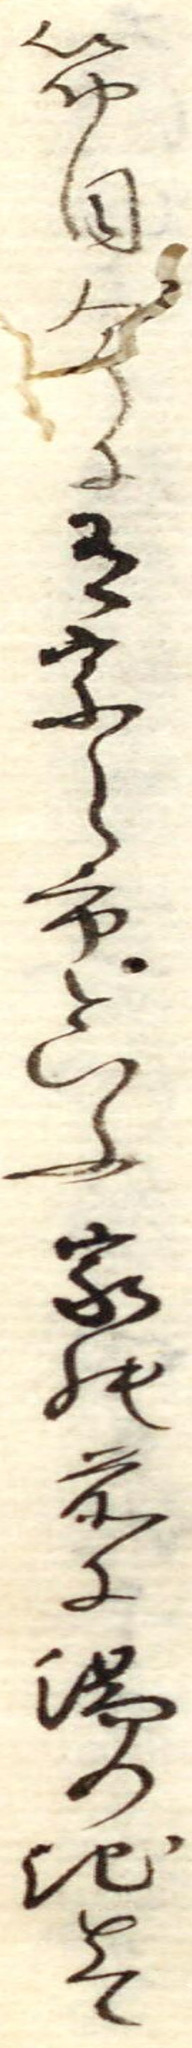筋目今に有宗し市といふ家の前に湯の池とて
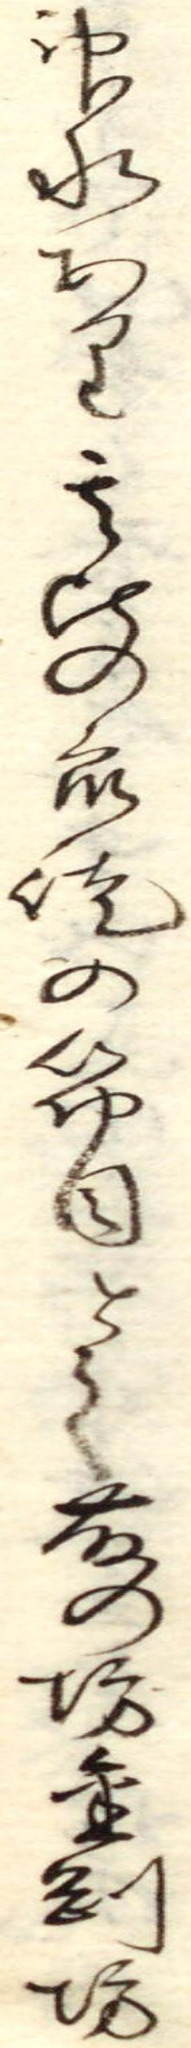神水あり其比の衆徒の筋目とて藤の坊重剛坊
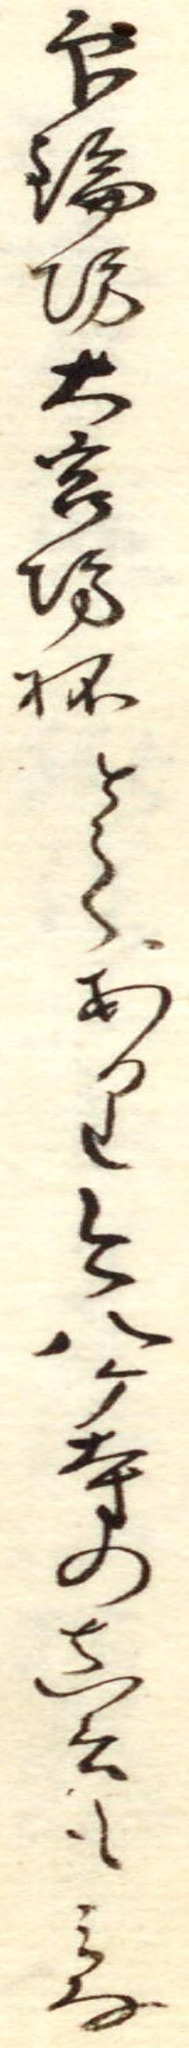印錀坊大宮坊抔とてあり今八ヶ寺の真言もみな
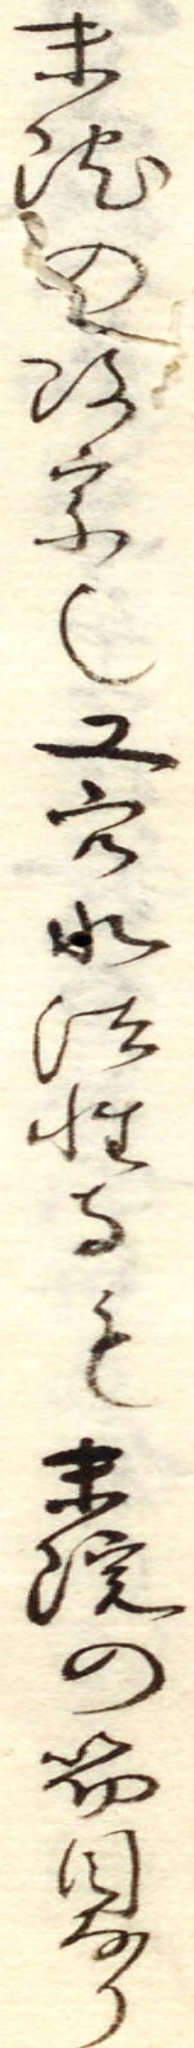末院の改宗也又穴水法性寺も末院の筋目なり
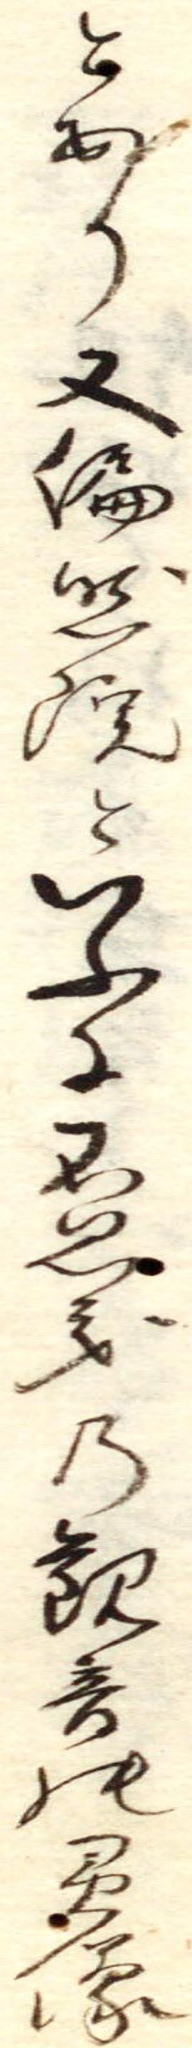とあり又偏然院といふに不思議の観音の霊像
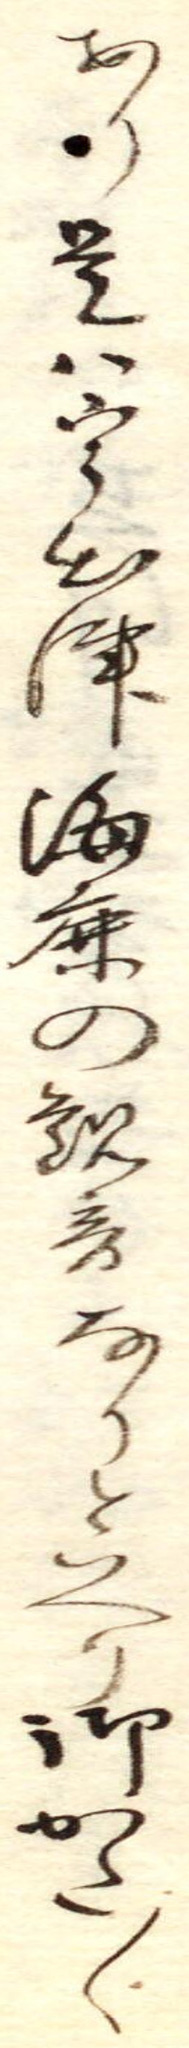あり是は宇出津海鹿の観音なりといへり御かた〳〵
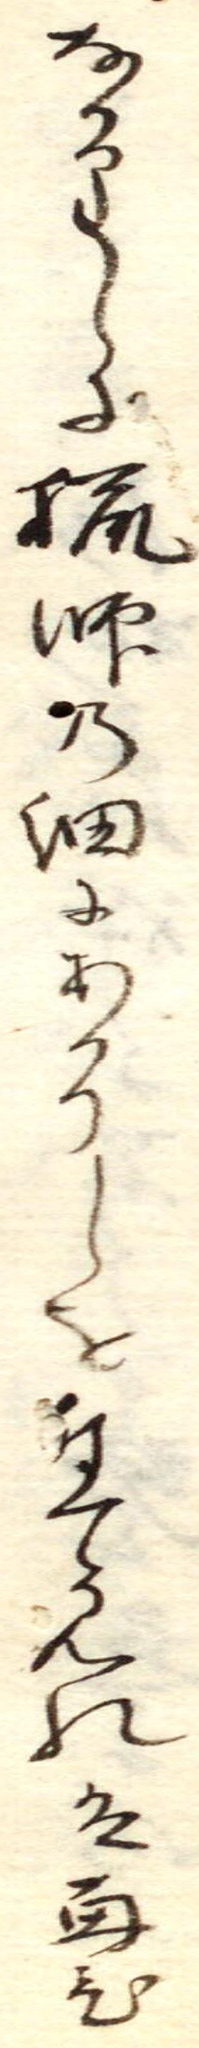なかりしに猟師の佃にあかりしを付て見れは再ひ
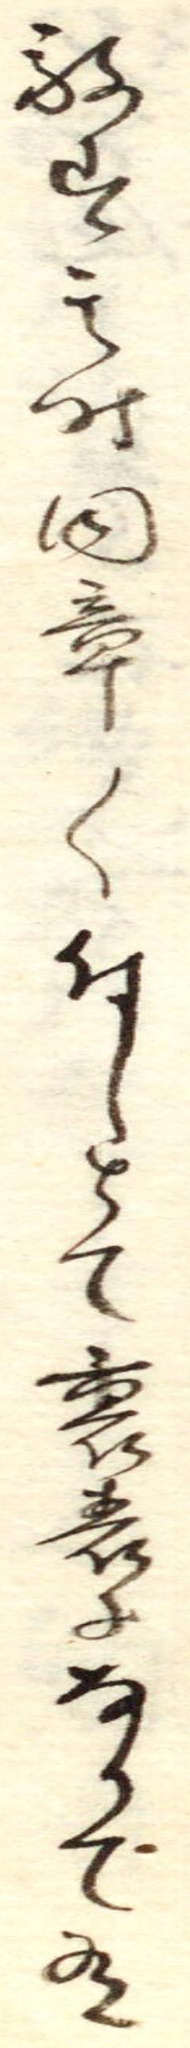放す其時因章〳〵付しとて裏表になりて有
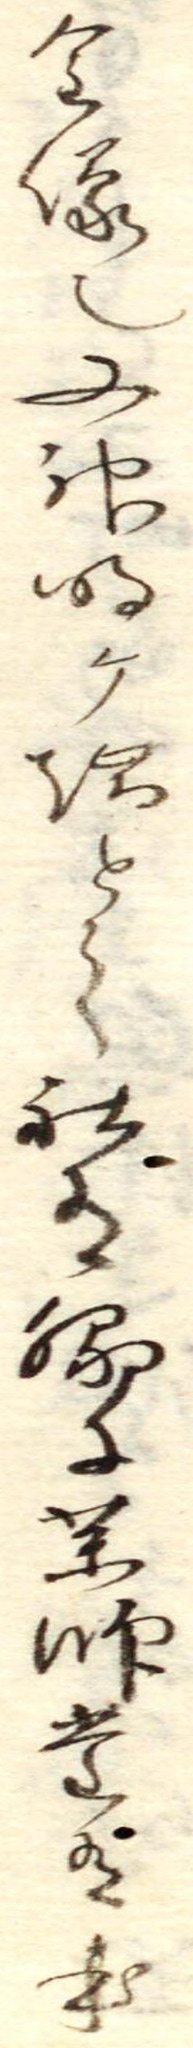金像也又神明ヶ端とて社有脇に薬師堂有本
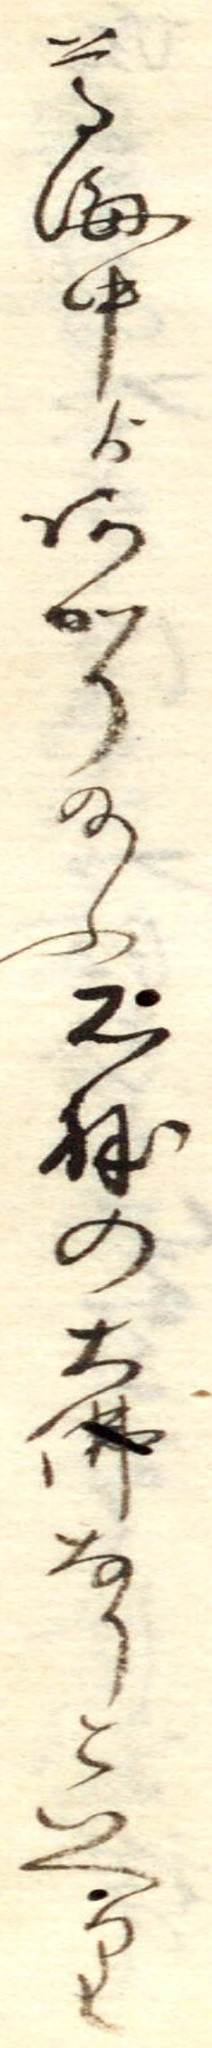尊海中ゟあかり給ふ石躰の大仏なりといへり
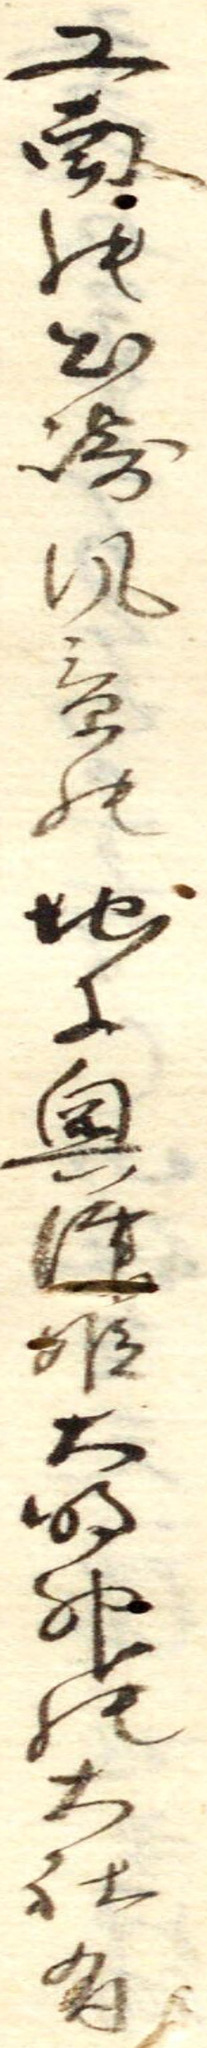又南の出崎風景の地に奥津姫大明神の大社有
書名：能登名跡誌
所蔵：Ishikawa Prefectural Library
